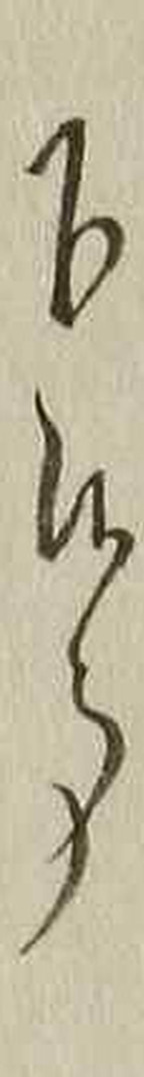下候事
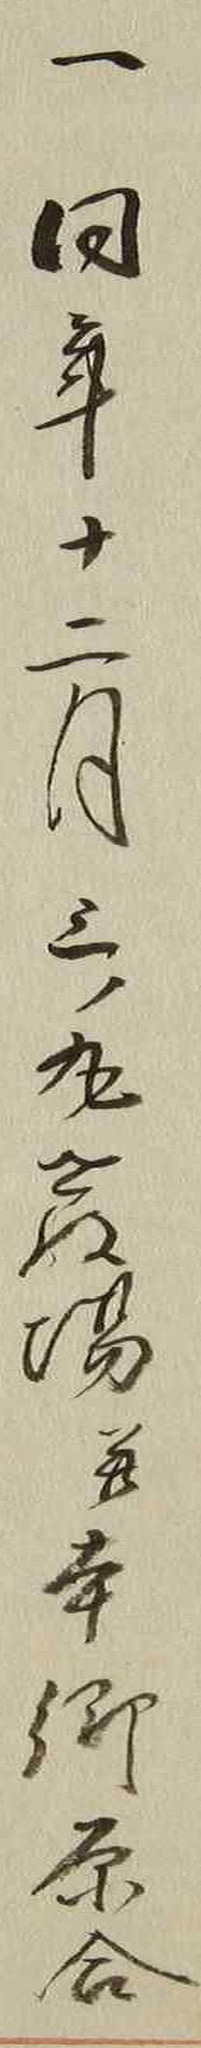一同年十二月三ノ丸教場并本郷原合
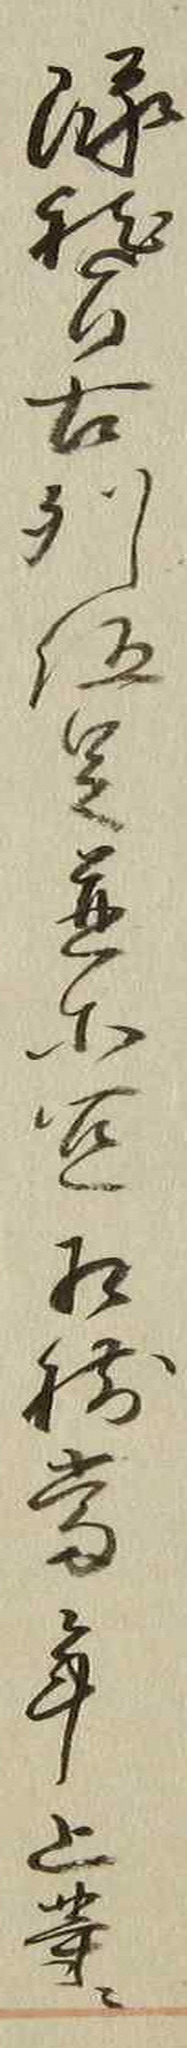隊稽古列伍足並等宜相揃当年上等ニ
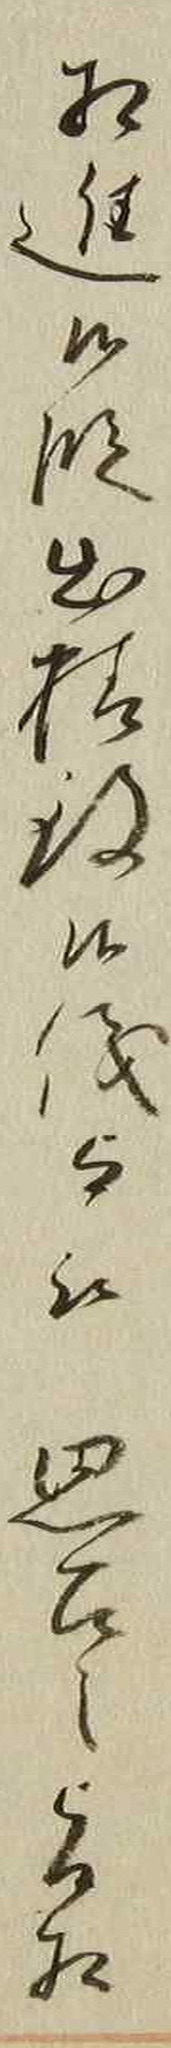相進候段出精致候儀与被思召之旨相
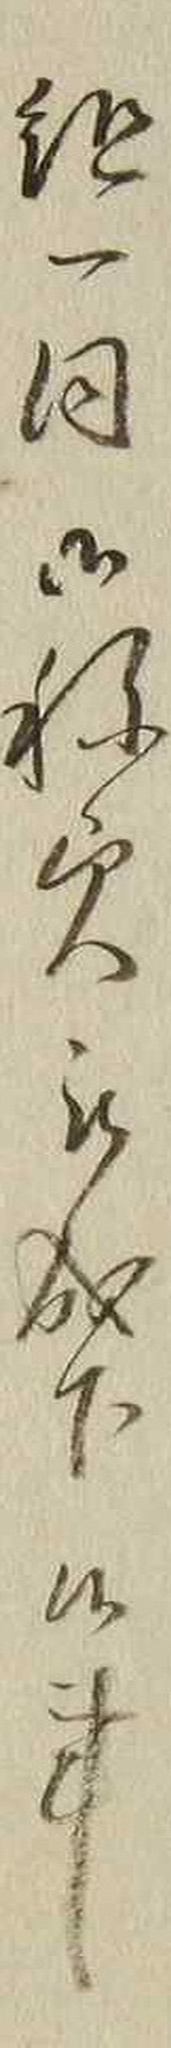組一同御称美被成下候事
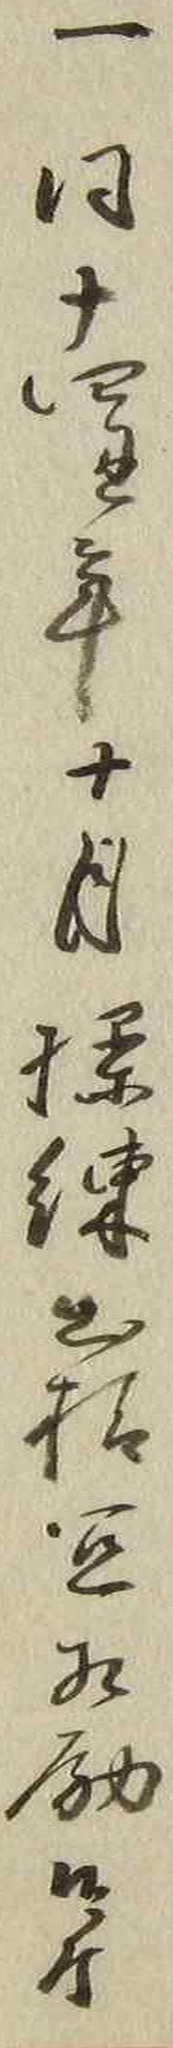一同十四丑年十月操練出精宜州相励候ニ付
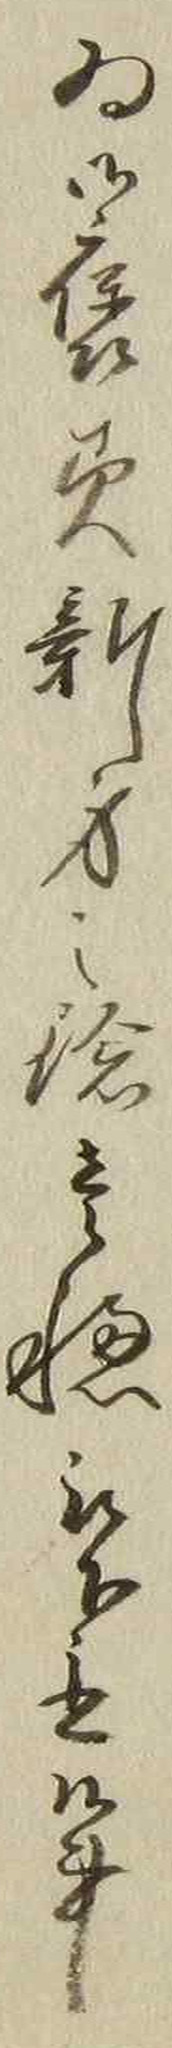為御褒美新身之鎗壱穂被下置候事
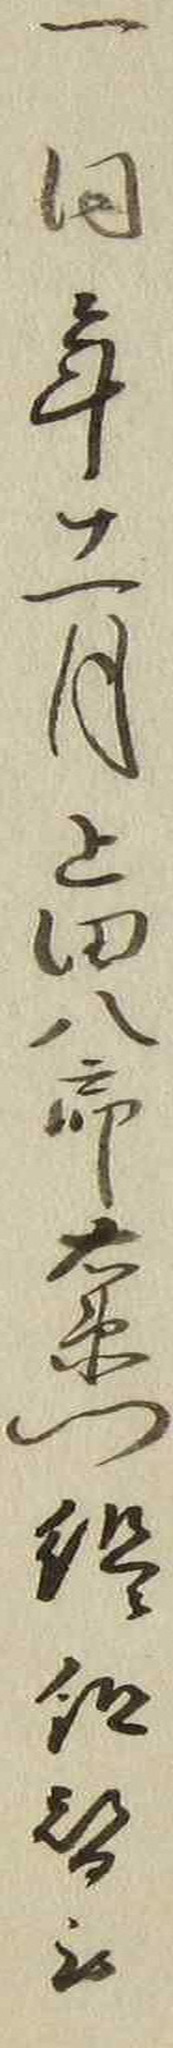一同年十一月上田八郎右衛門組ニ組替被
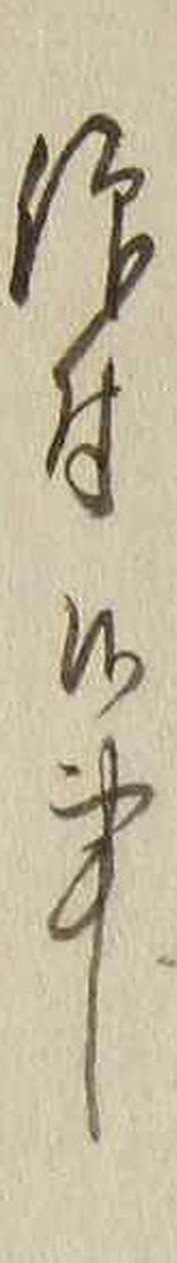仰付候事
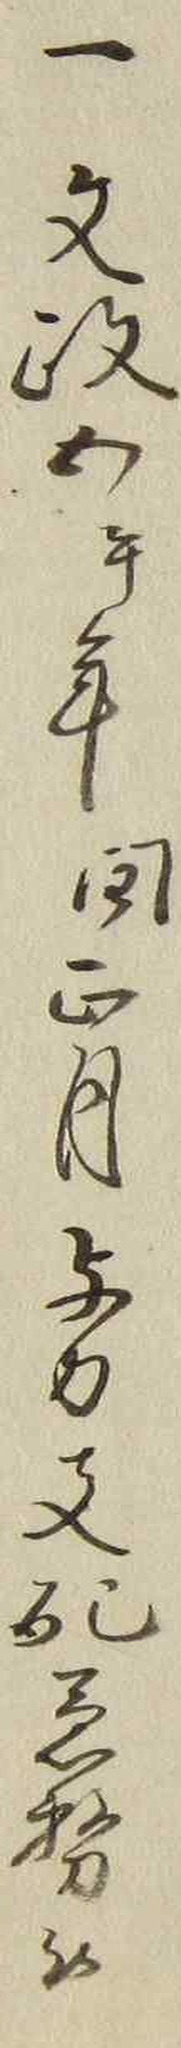一文政午年同正月与力支配兼務被
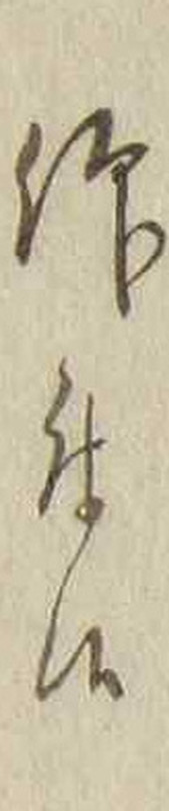仰付候
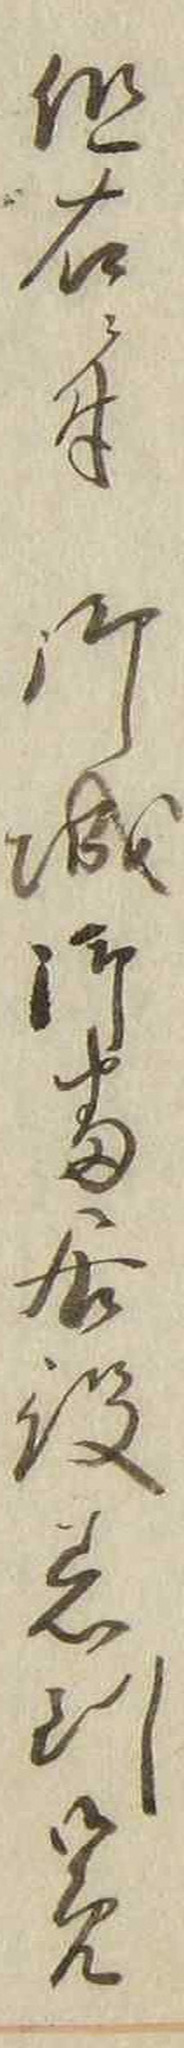但右ニ付御城御番居役着列御免

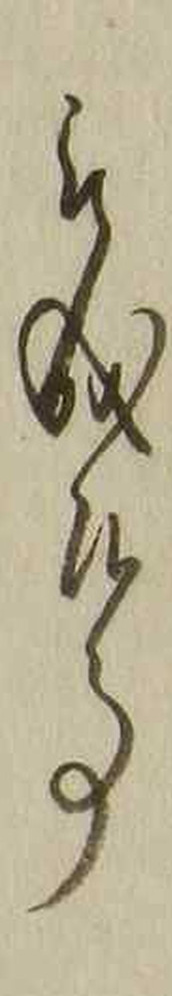被成候事
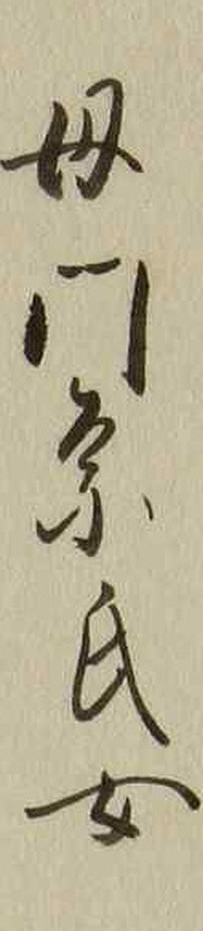母門原氏女
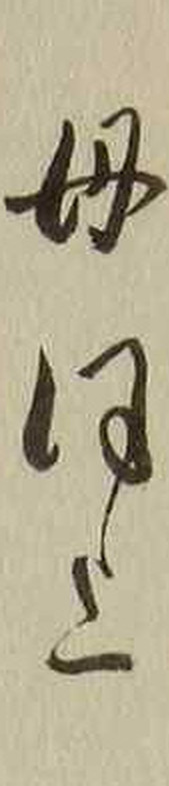母同上
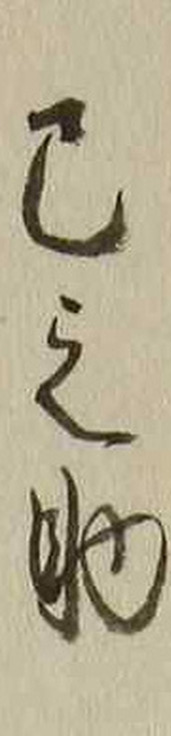巳之助
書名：諸士系譜　巻之122　よ之部5
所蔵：会津若松市立会津図書館
